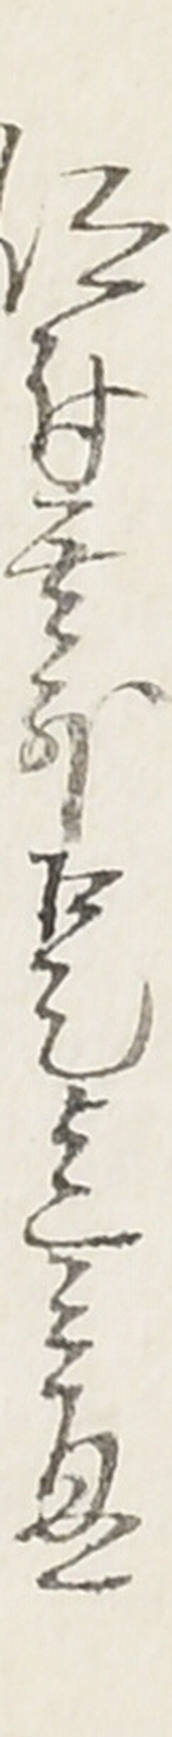仰付其外是迄之通
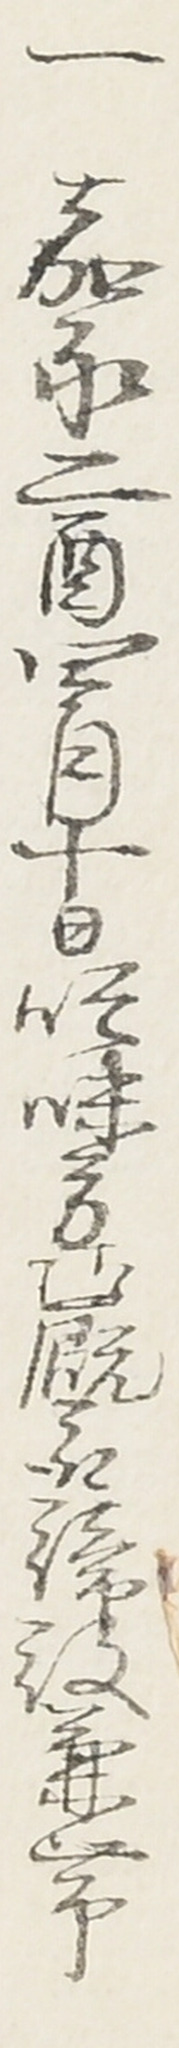一嘉永二酉四月十日吟味方御厩取締役兼帯
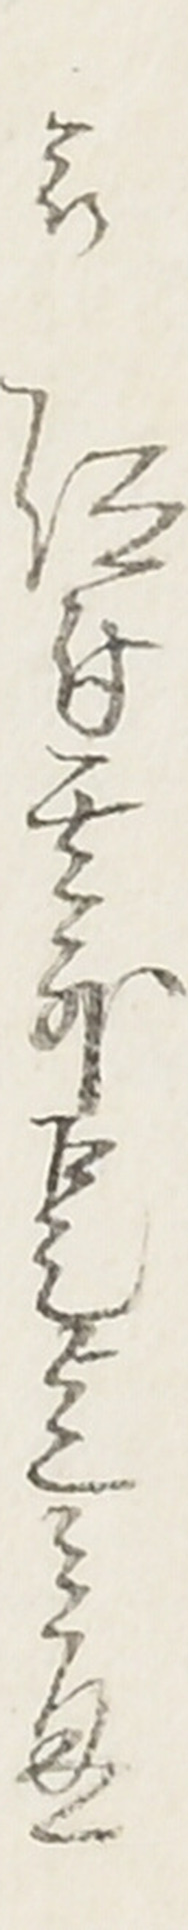被仰付其外是迄之通
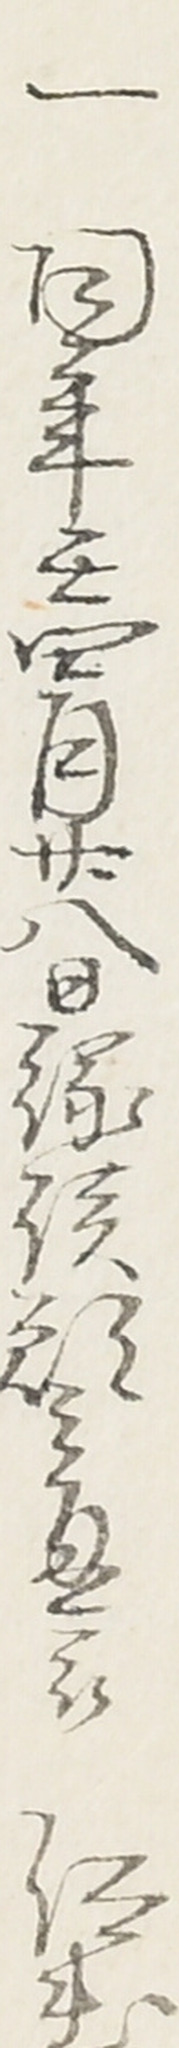一同年閏四月廿八日縁談願之通被仰出
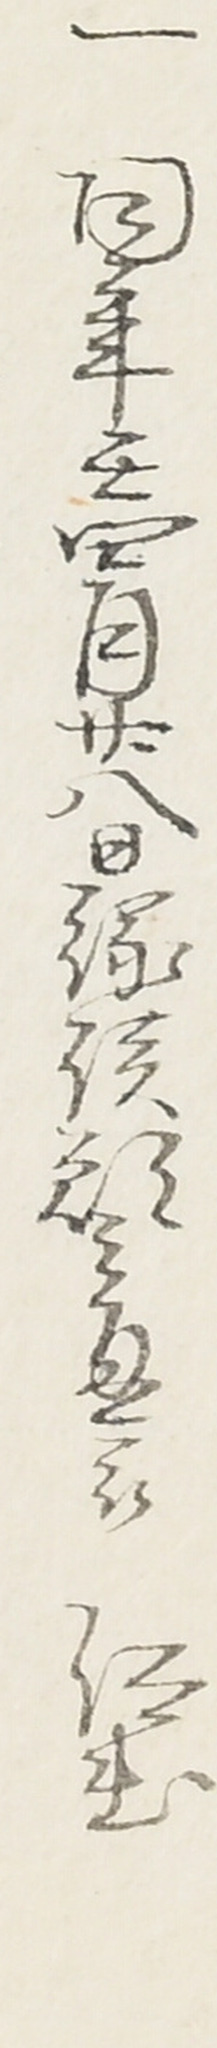一同年閏四月廿八日縁談願之通被仰出
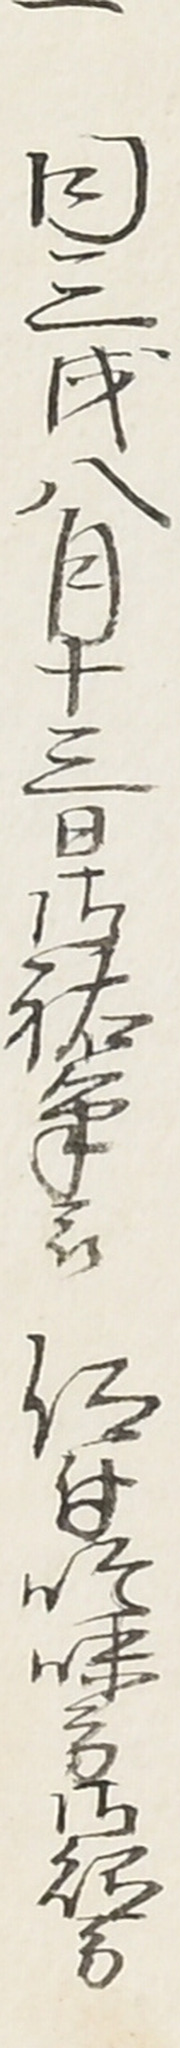一同三戊八月十三日御祐筆被仰付吟味方御賄方
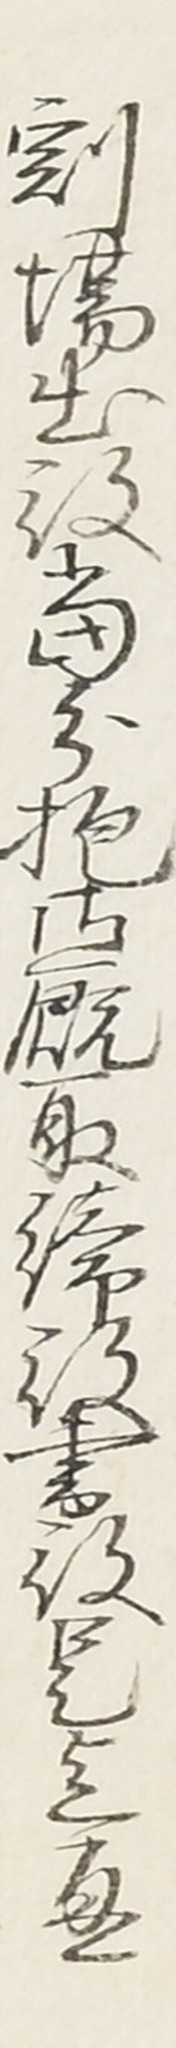割場出役当分抱御厩取締役書役是迄之通
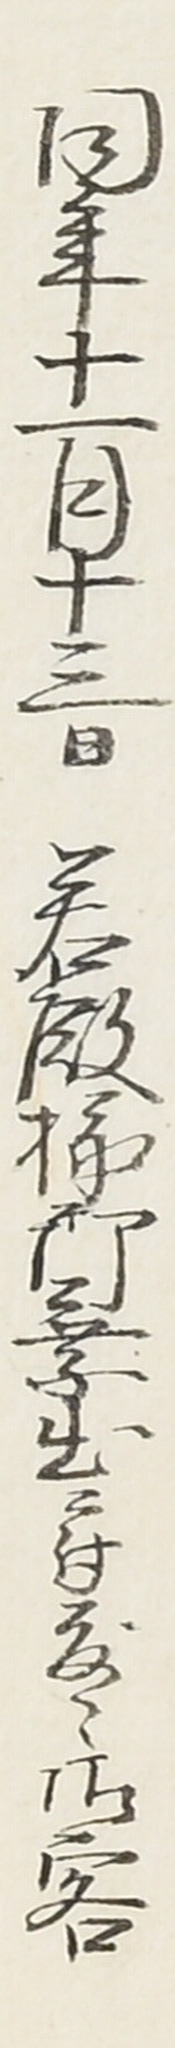一同年十一月十三日若殿様御乗出ニ付度々御客
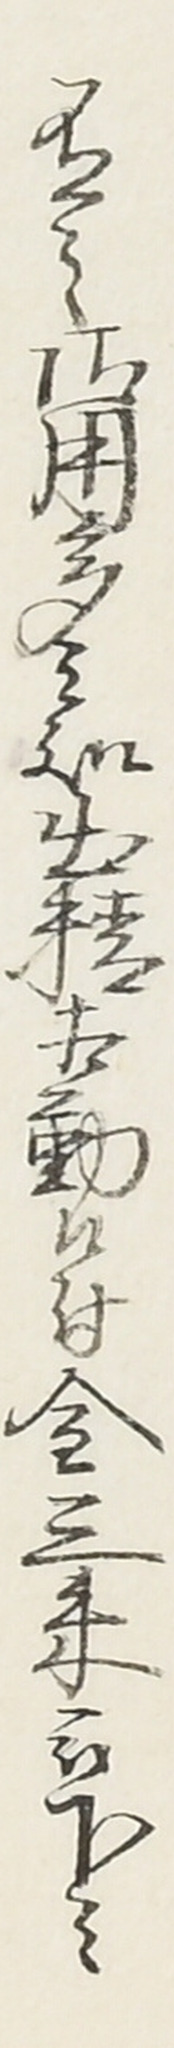有之御用多之処出精相勤候付金三朱被下之
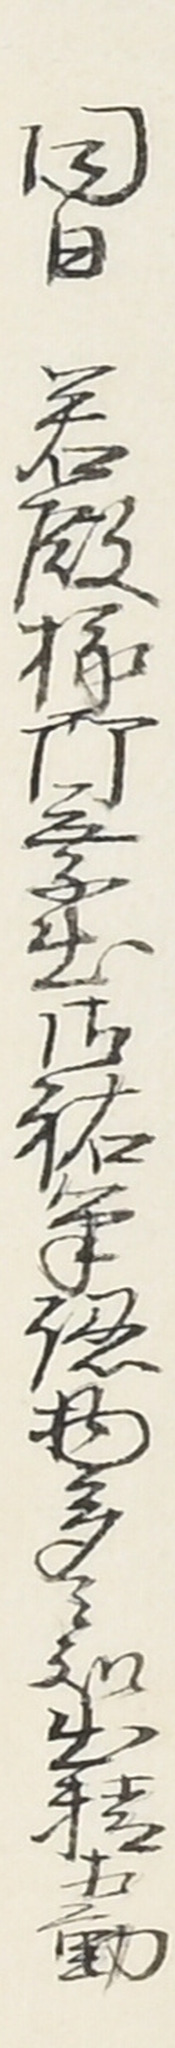一同日若殿様御乗出御祐筆認物多之処出精相勤

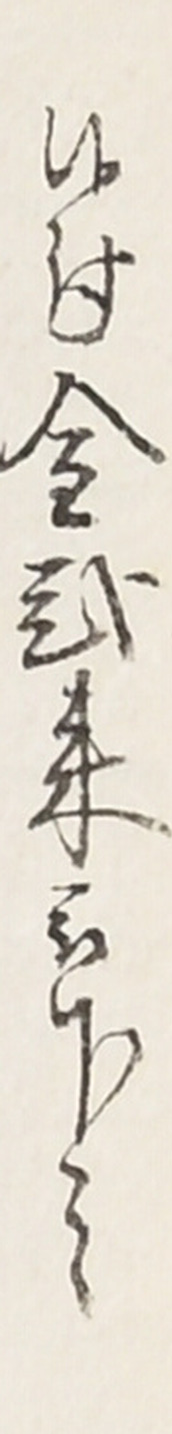候付金弐朱被下之
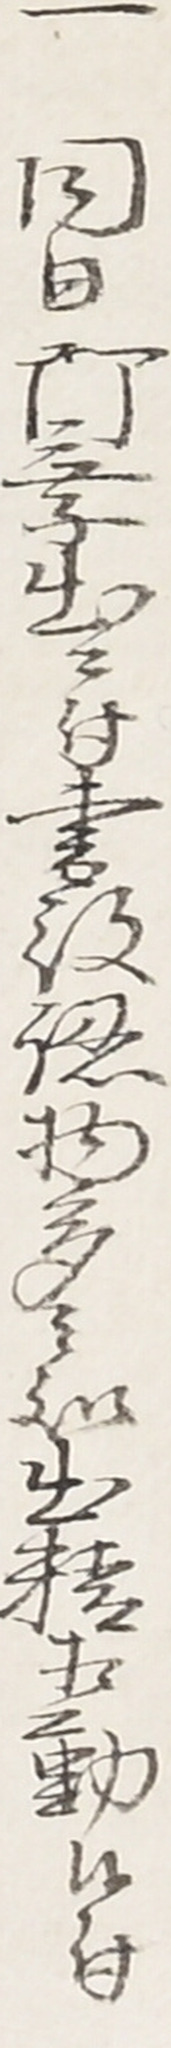一同日御乗出ニ付書役認物多之処出精相勤候付
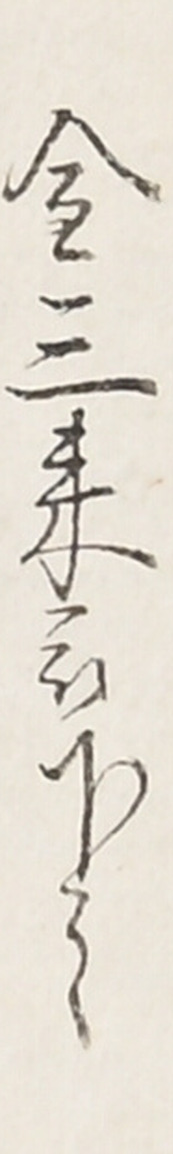金三朱被下之

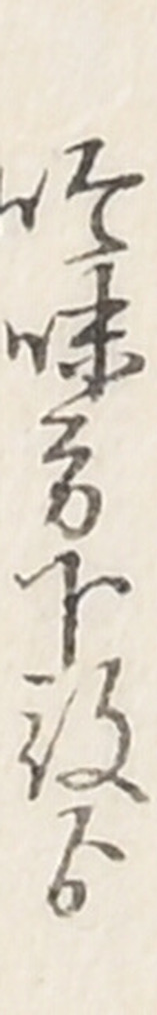吟味方下役ゟ
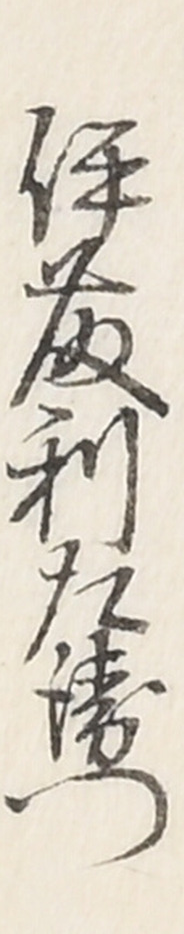伊藤利左衛門
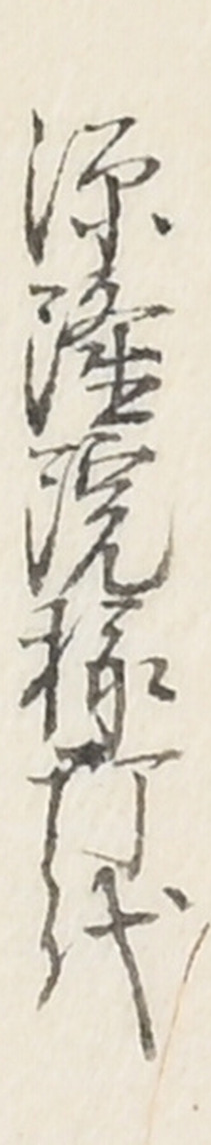源隆院様御代
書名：無足諸士勤仕録（四）
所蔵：伊那市立高遠町図書館・合同会社AMANE
